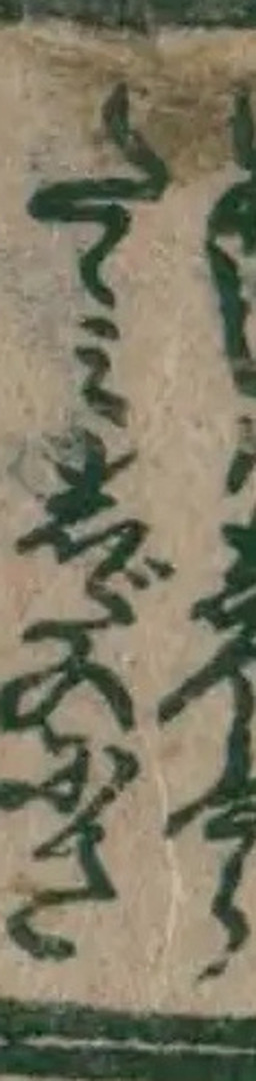たゝみしだゐにさ
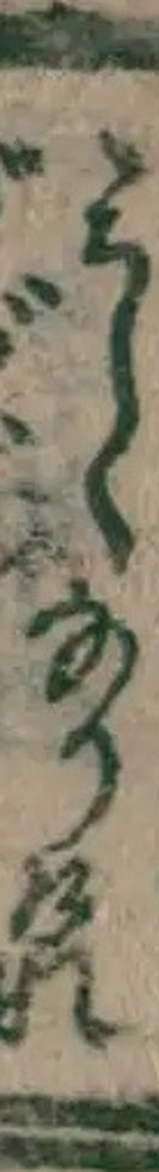みしくなりけれ
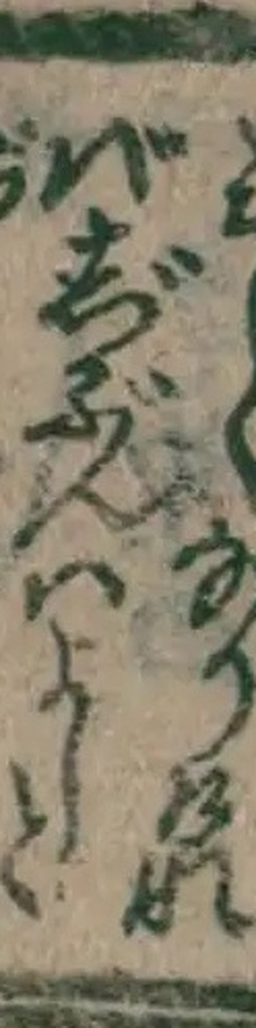ばじぶんはよしと
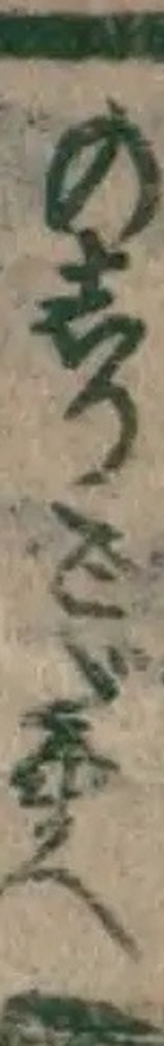のしりでだまへ
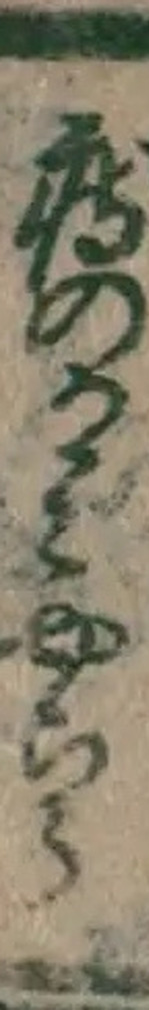痔のかみやらう
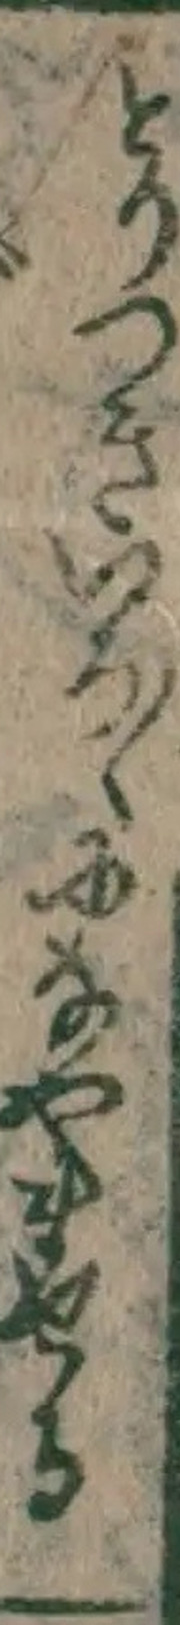とりつきいろ〳〵になやませる
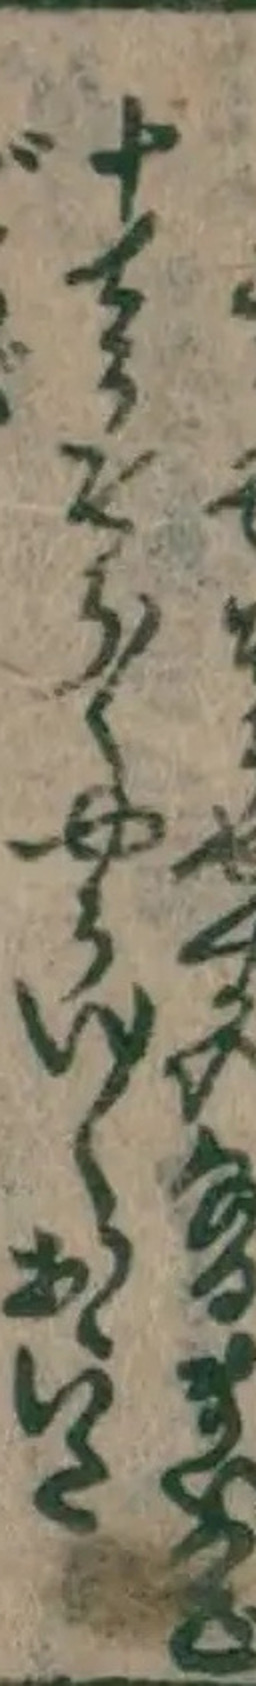十てうそう〳〵やうい〳〵おいた
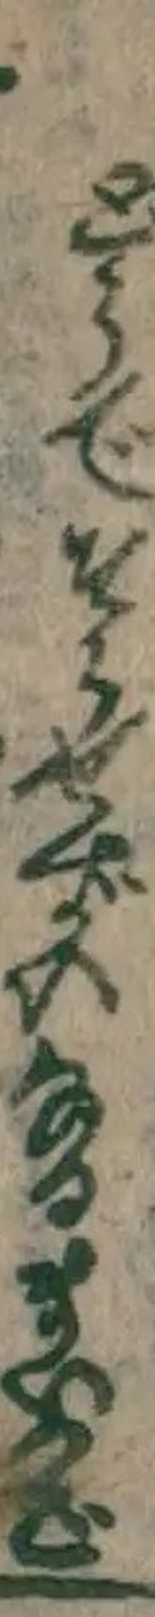どうでそうせずはなるまいかど
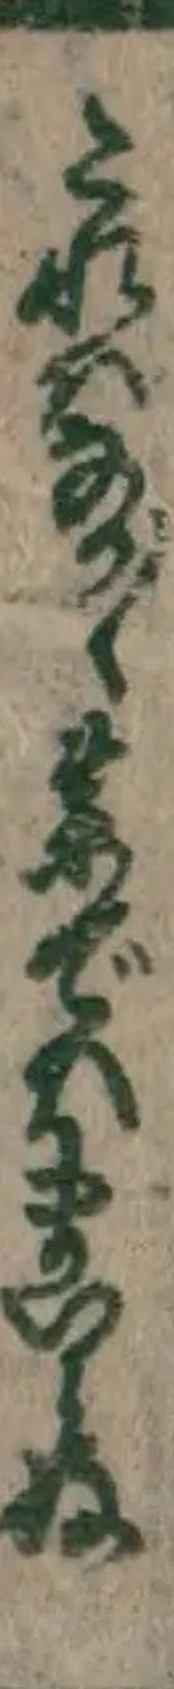これはなか〳〵まめではまいらぬ
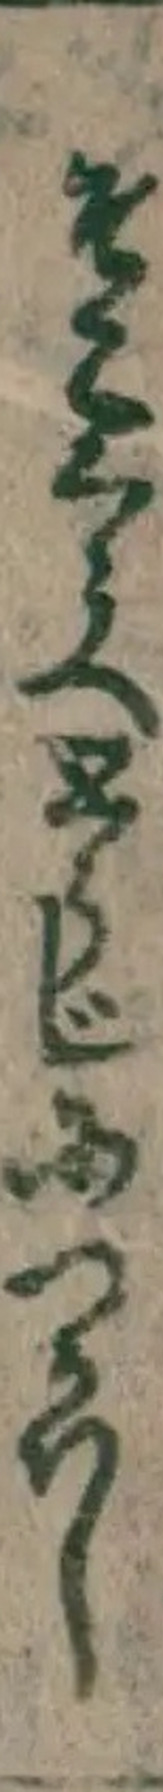そこたうへとうじにつかいし
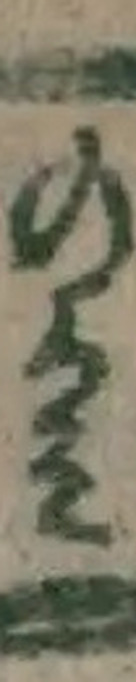のかみ
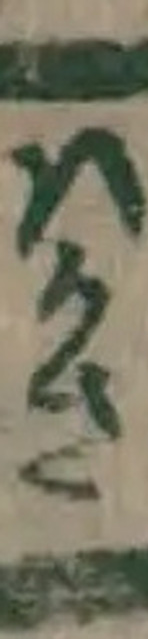はかさ
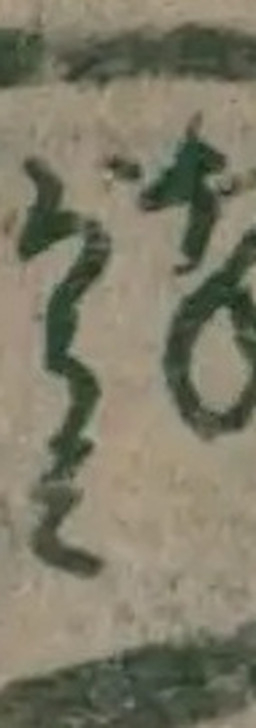がらみ
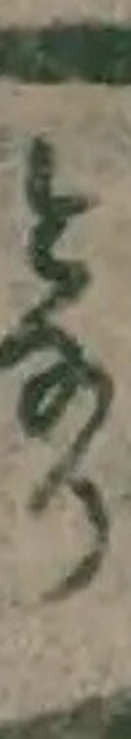となり
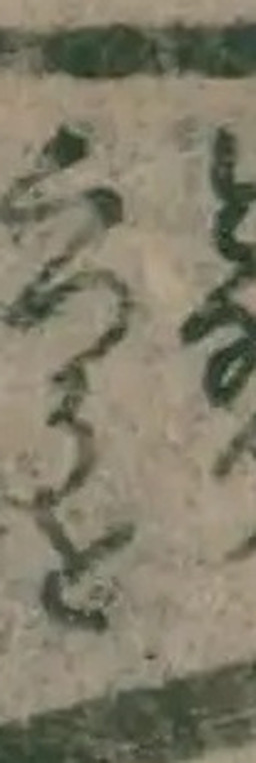くつうを
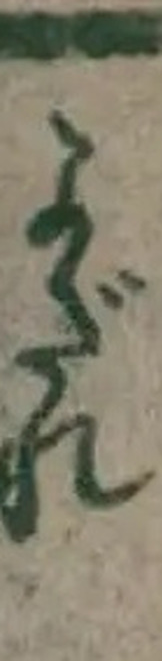よだれ
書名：頓作時雨月 3巻
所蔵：国立国会図書館 National Diet Library, JAPAN
